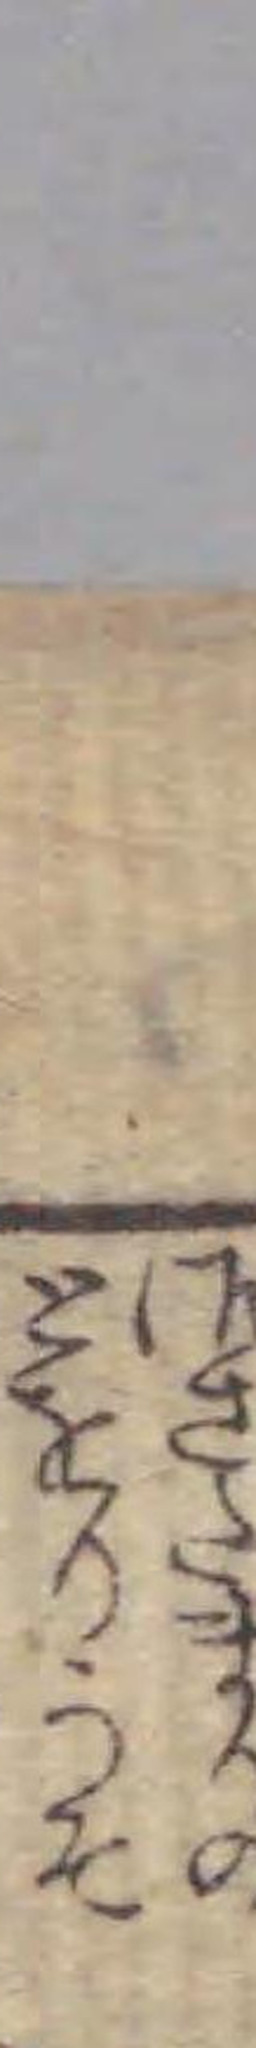とをりうそ
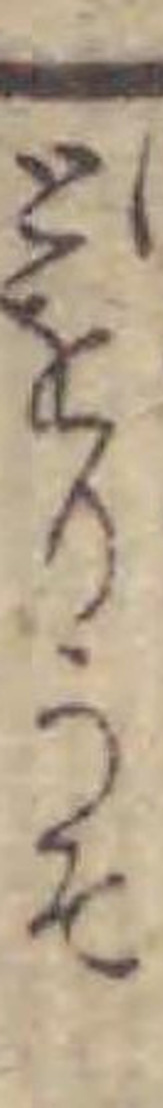とをりうそ
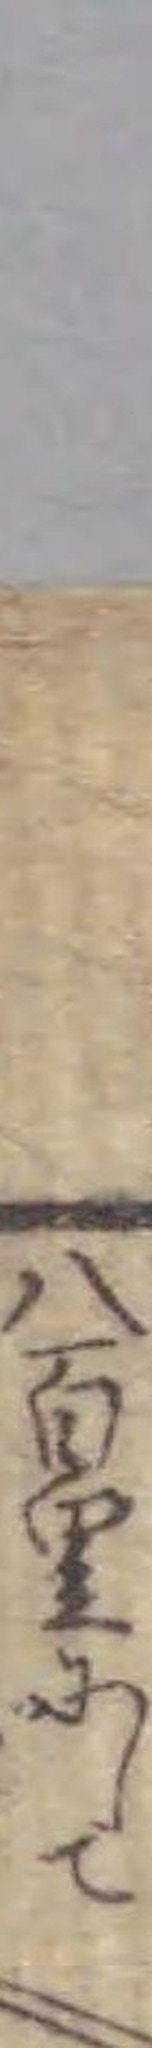八百里にして
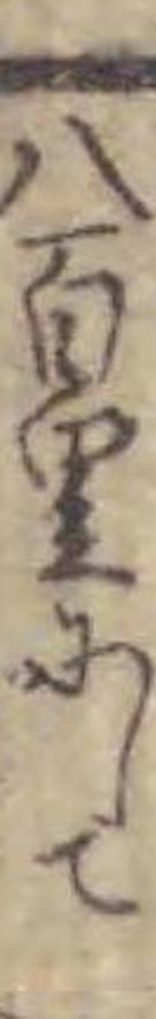八百里にして
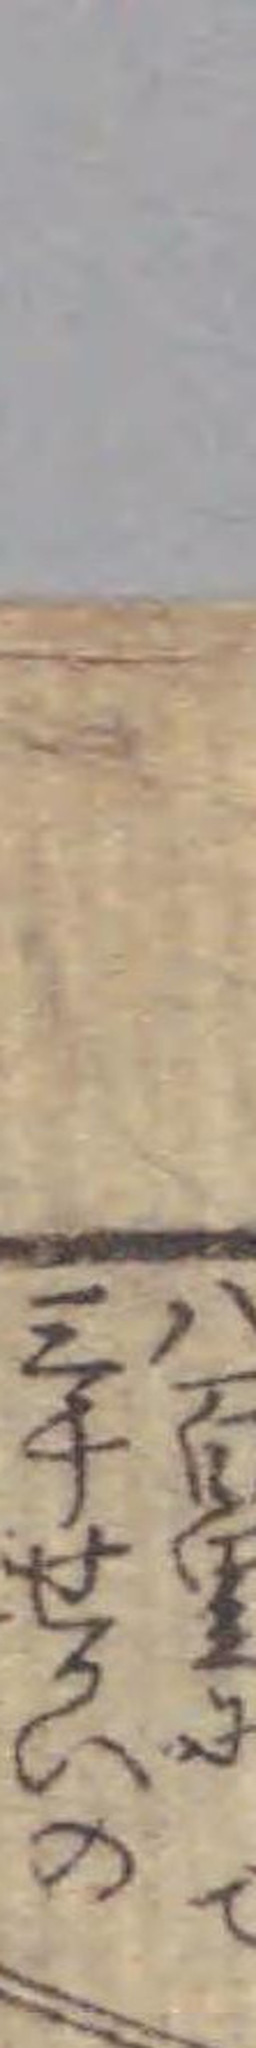三千せかいの
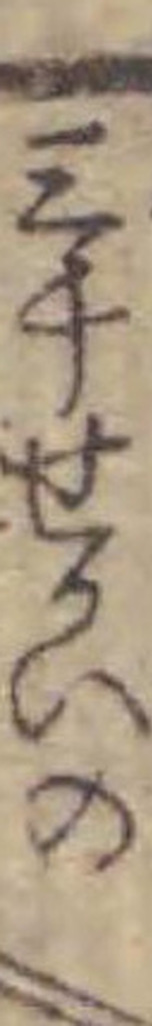三千せかいの
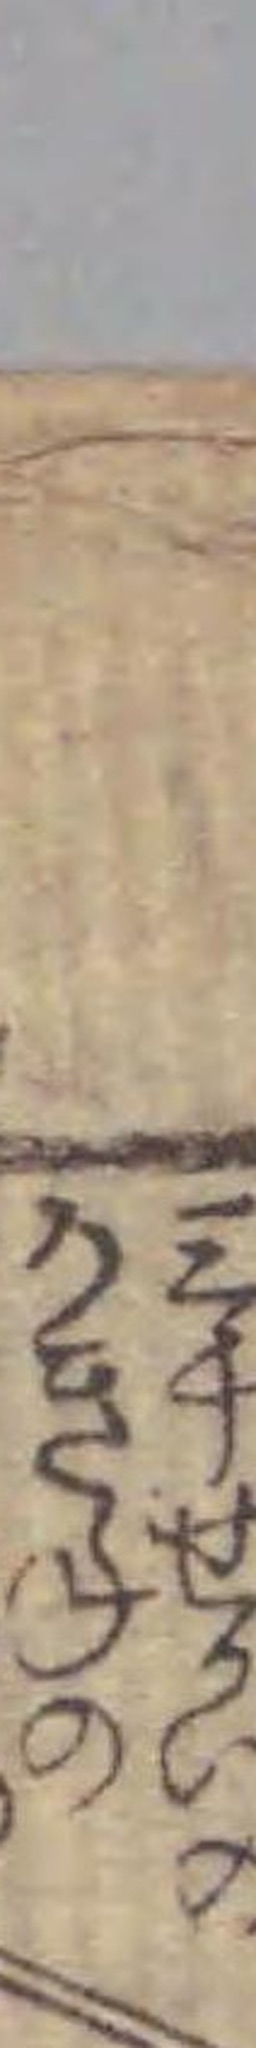かきねの
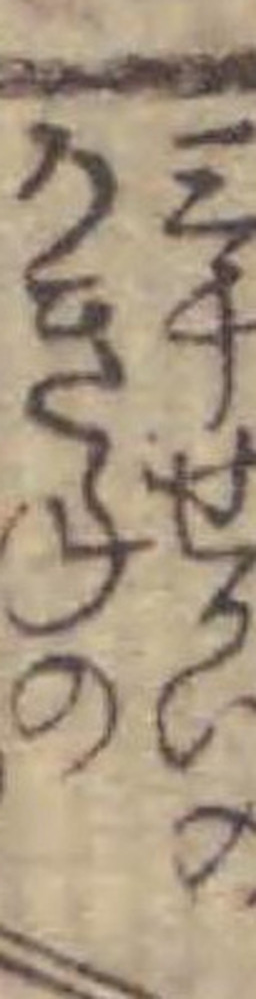かきねの
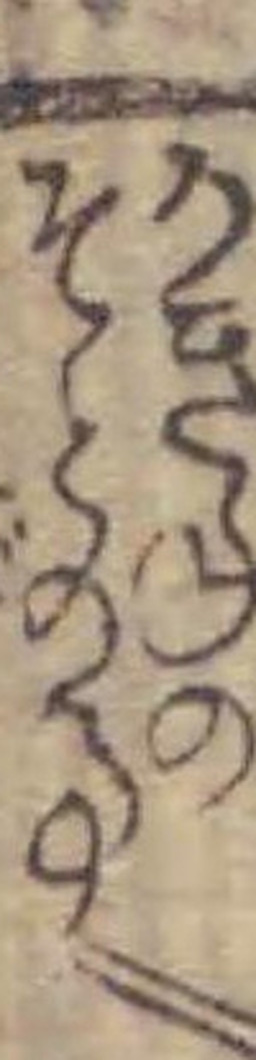そとの事
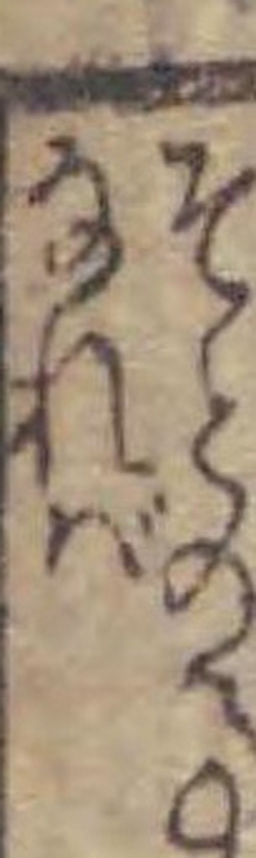なれば
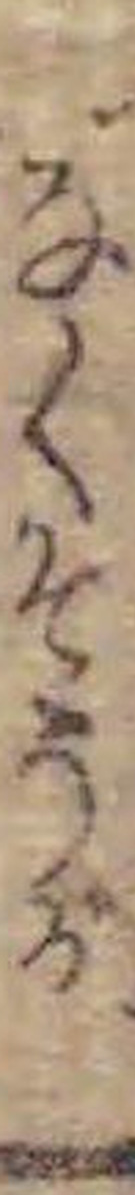なくそうが
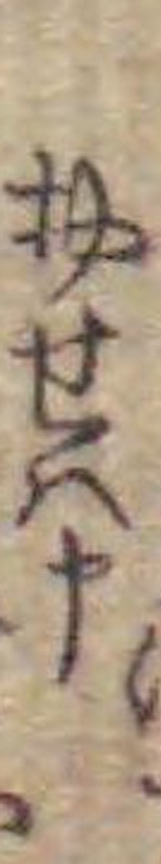おせは申
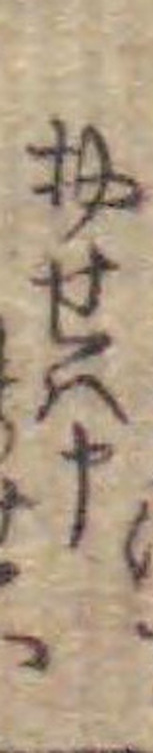おせは申
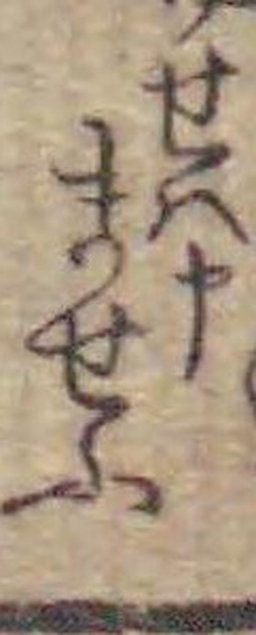ませふ
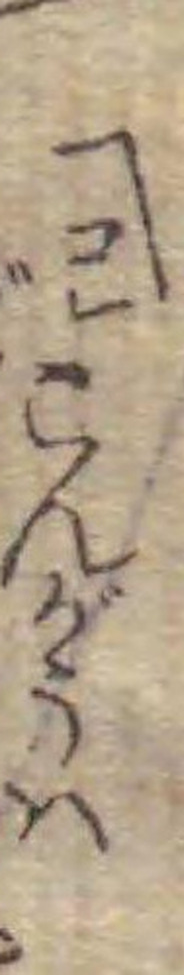〽コレこんがうは
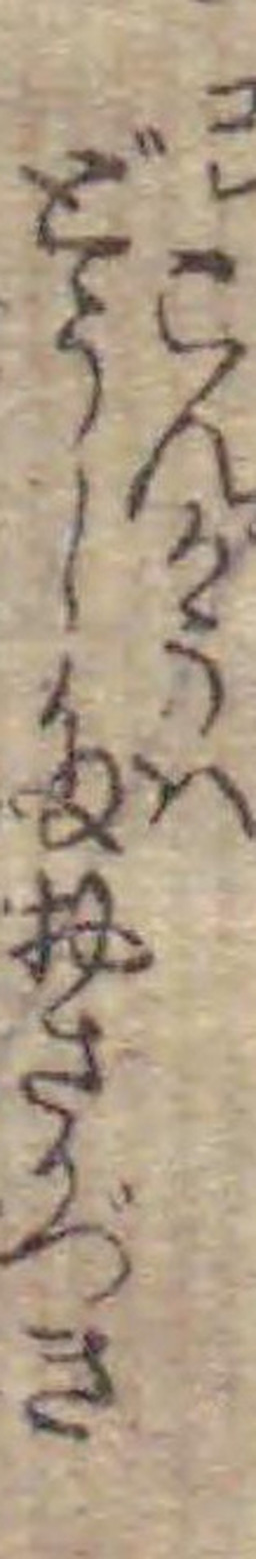どうしたおさかづき
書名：奇妙頂礼胎錫杖 : 3巻
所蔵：国立国会図書館 National Diet Library, JAPAN
